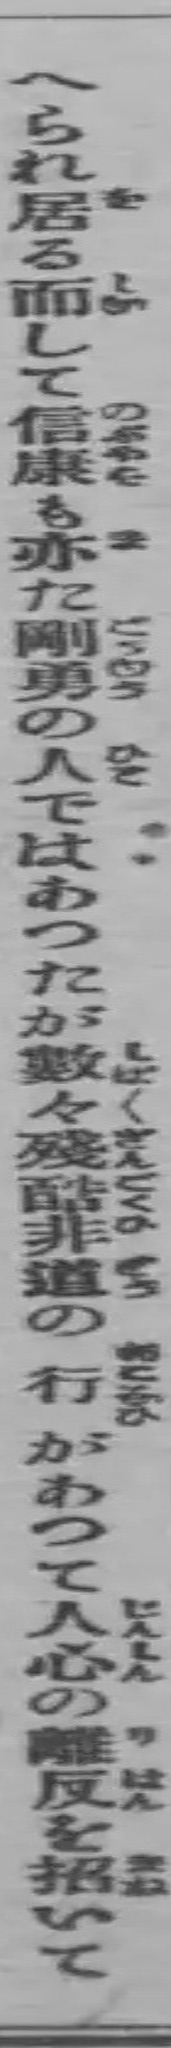へられ居る而して信康も亦た剛勇の人ではあつたが数々残酷非道の行があつて人心の離反を招いて
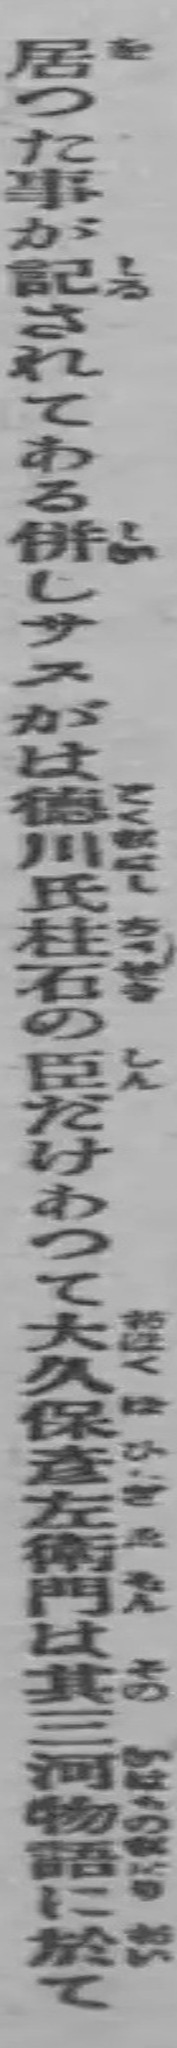居つたこと事が記されてある併しサスがは徳川氏柱石の臣だけあつて大久保彦左衛門は其三河物語に於て
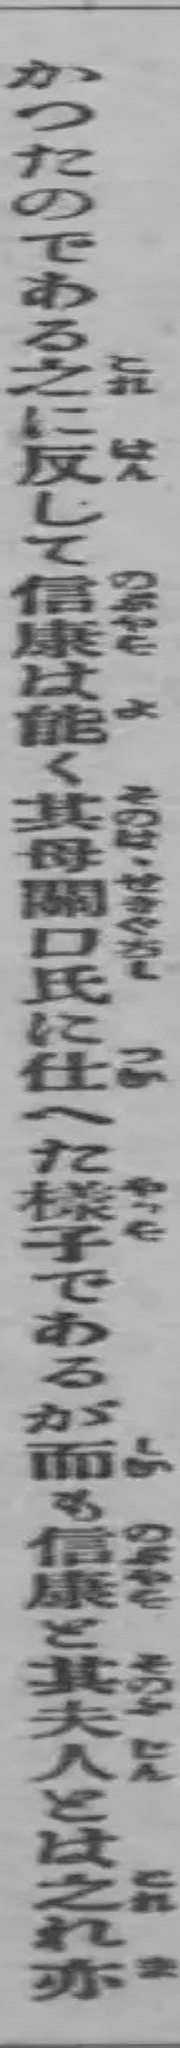かつたのである之に反して信康は能く其母関口氏に仕へた様子である而も信康と其夫人とは之亦
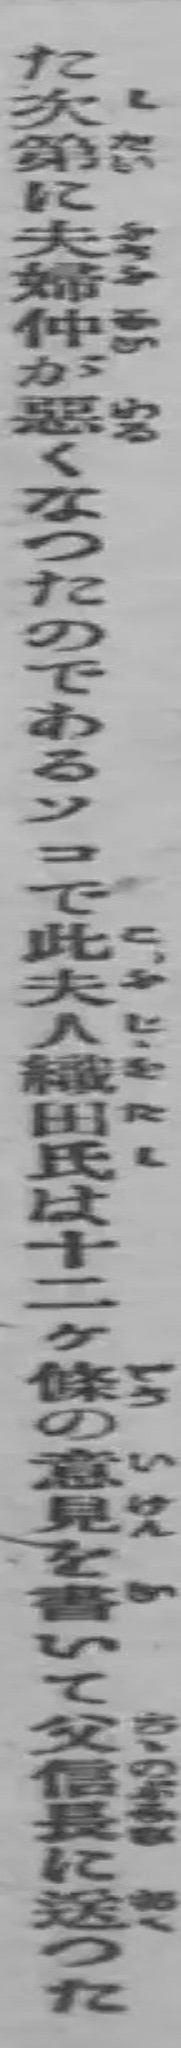た次第に夫婦仲が悪くなつたのであるソコで此夫人織田氏は十二ケ条の意見を書いて父信長に送つた
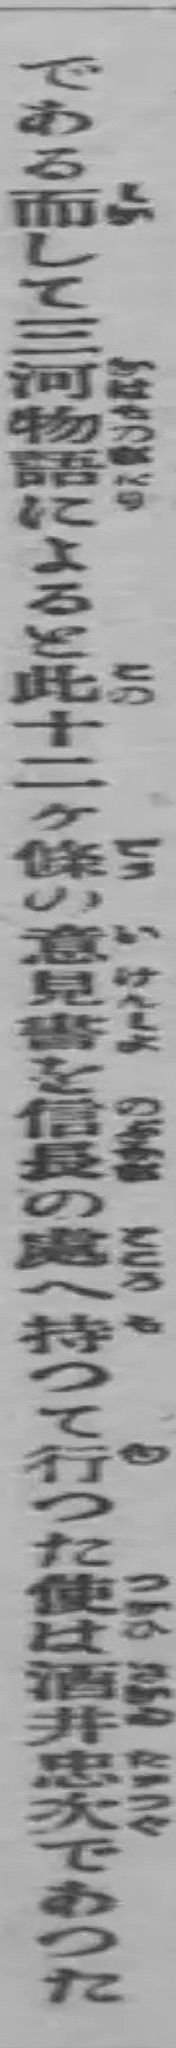るである而して三河物語によると此十二ケ条の意見書を信長の処へ持つて行つた使は酒井忠次であつた
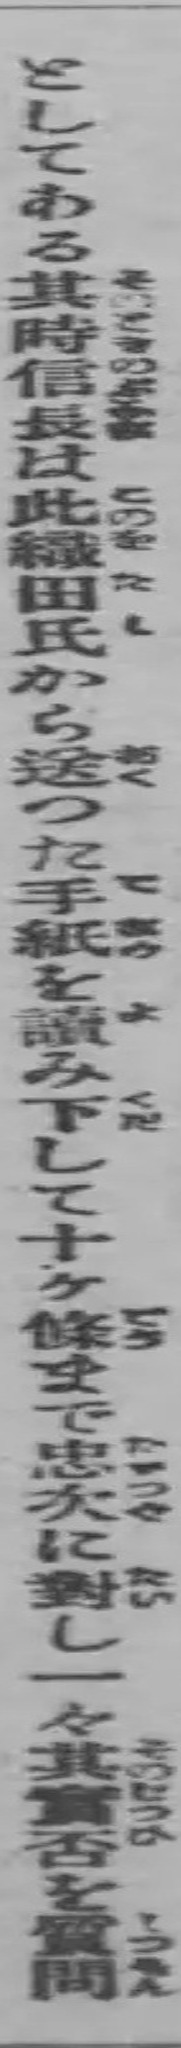としてある其時信長は此織田氏から送つた手紙を読み下して十ケ条まで忠次に対し一々其実否を質問
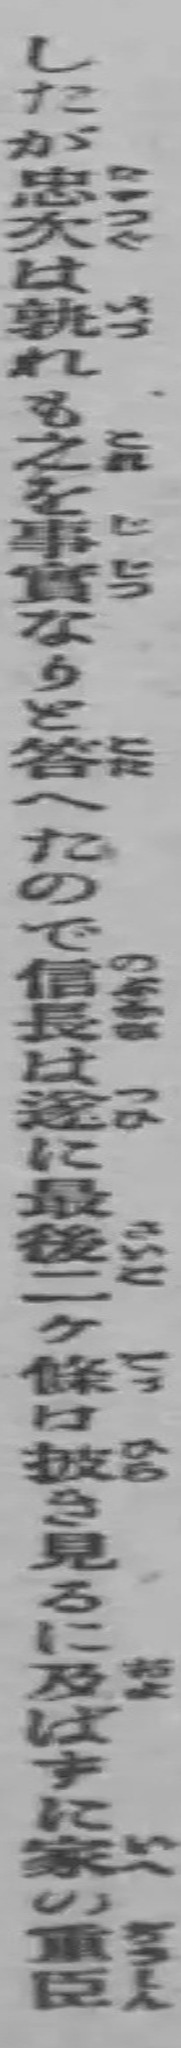したが忠次は孰れも之を事実なりと答へたので信長は遂に最後二ケ条は披き見るに及ばずに家の重臣
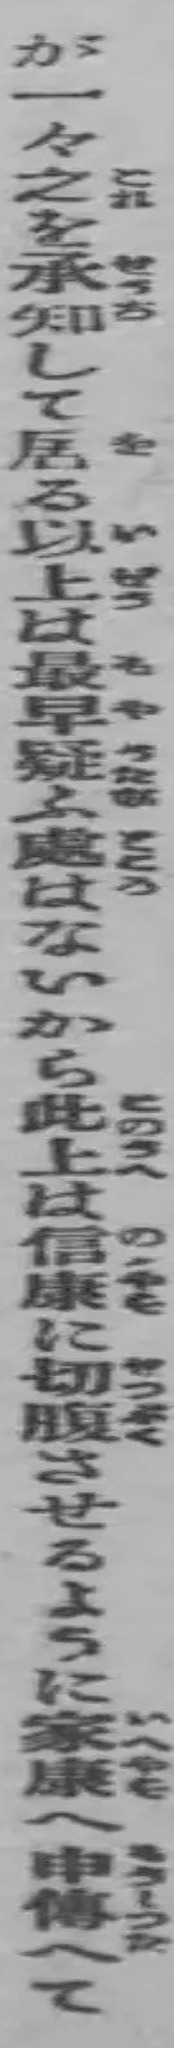が一々之を承知して居る以上は最早疑ふ処はないから此上は信康に切腹させるように家康へ申伝へて
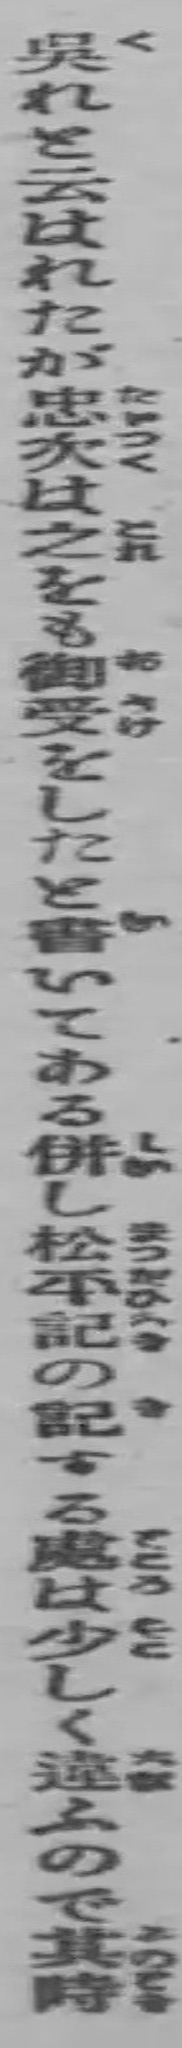呉れと云はれたが忠次は之をも御受をしたと書いてある併し松平記の記する処は少しく違ふので其時
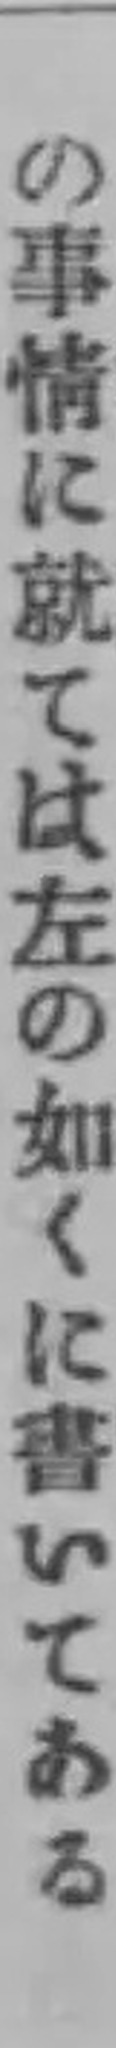の事情に就ては左の如くに書いてある
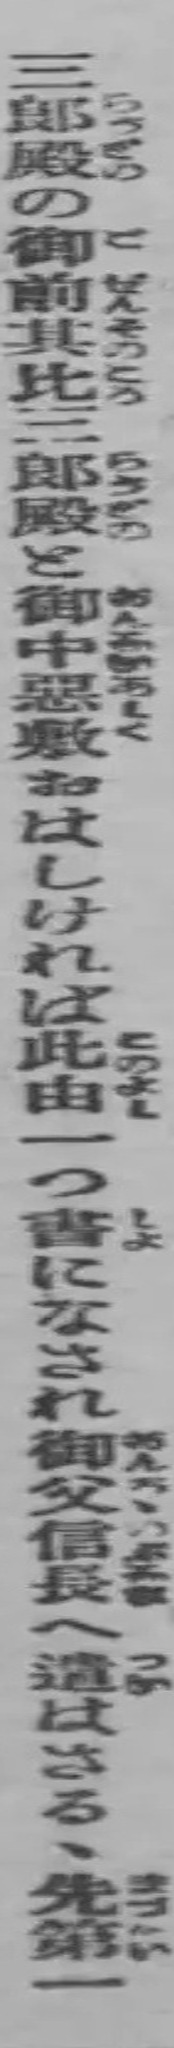三郎殿の御前其比三郎殿と御中悪敷おはしければ此由一つ書になされ御父信長へ遣はさるゝ先第一
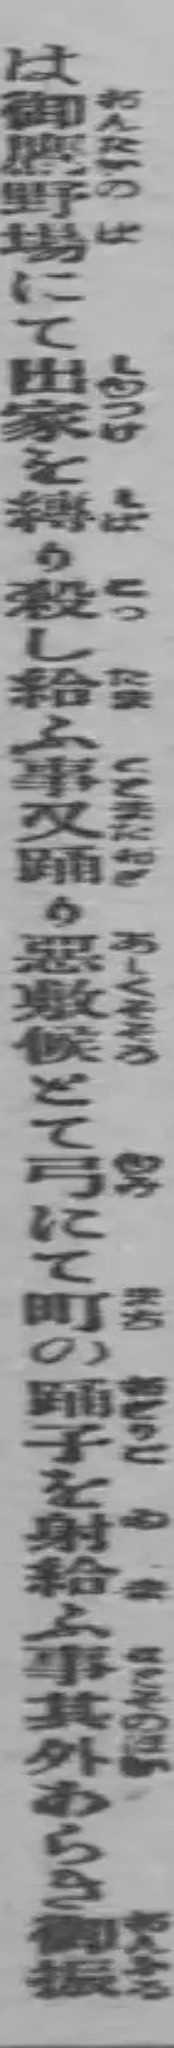は御鷹野場にて出家を縛り殺し給ふ事又踊り悪敷候とて弓にて町の踊子を射給ふ事其外あらき御振
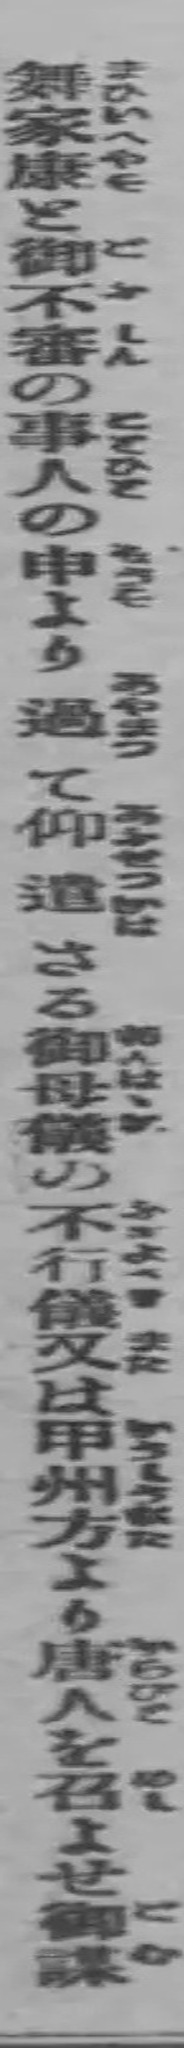舞家康と御不審の事人の申より過て仰遣さる御母儀の不行儀又は甲州方より唐人を召よせ御謀

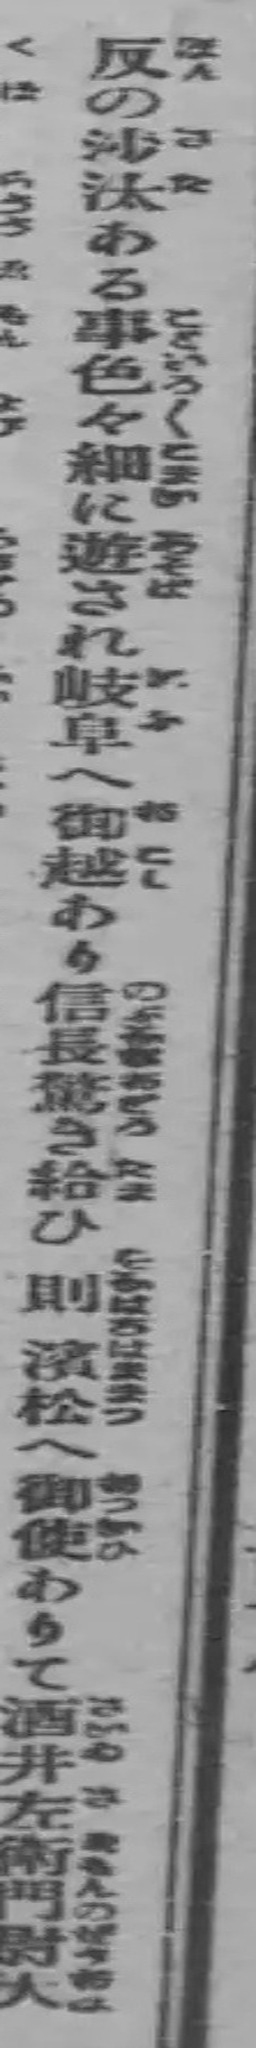反の沙汰ある事色々細に遊され岐阜へ御越あり信長驚き給ひ則浜松へ御使ありて酒井左衛門尉大
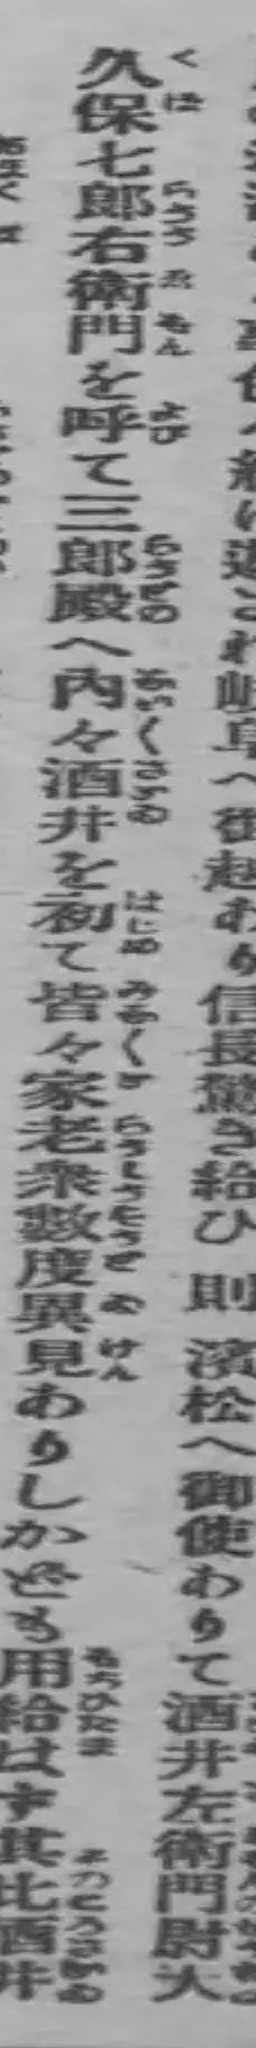久保七郎右衛門を呼て三郎殿へ内々酒井を初て皆々家老衆数度異見ありしかども用給はず其比酒井
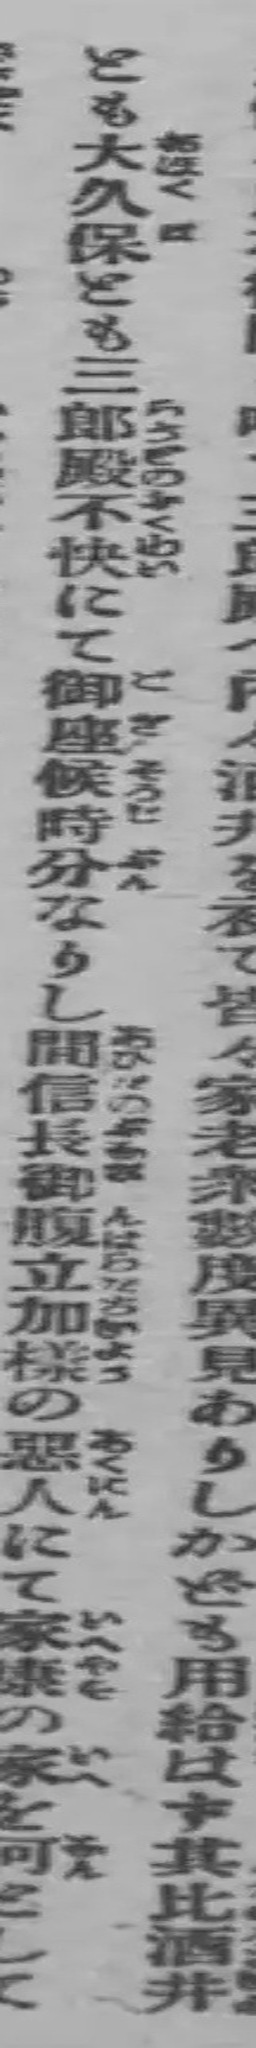とも大久保とも三郎殿不快にて御座候時分なりし間信長御腹立加様の悪人にて家康の家を何として
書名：豊橋市史談
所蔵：国立国会図書館 National Diet Library, JAPAN
